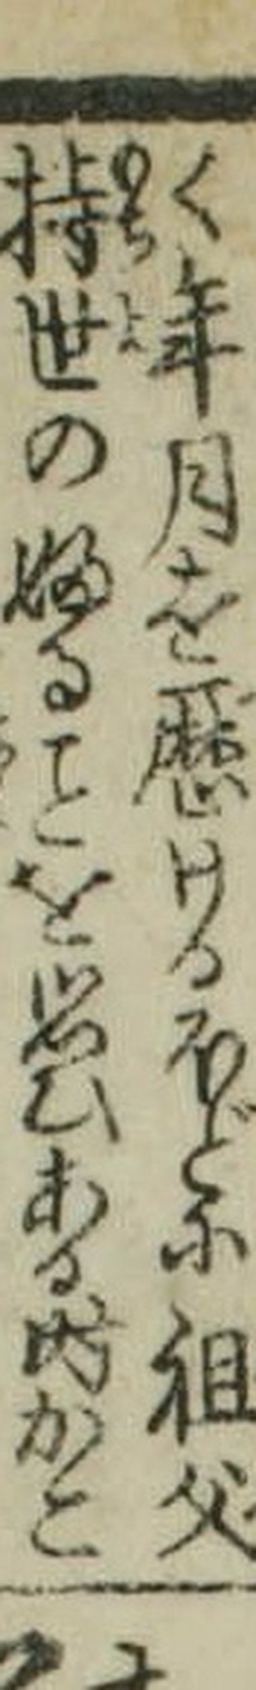持世のふることを思ひある時かこ
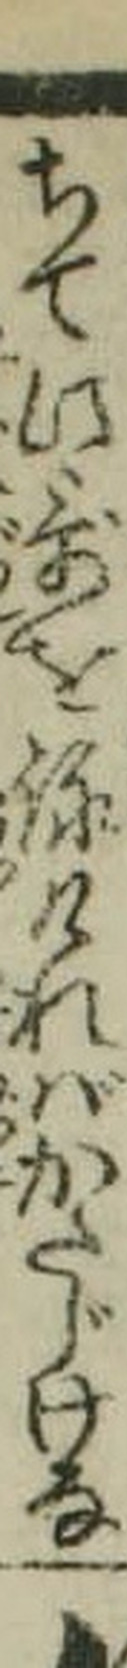ちて此哥を詠ければかたじけな
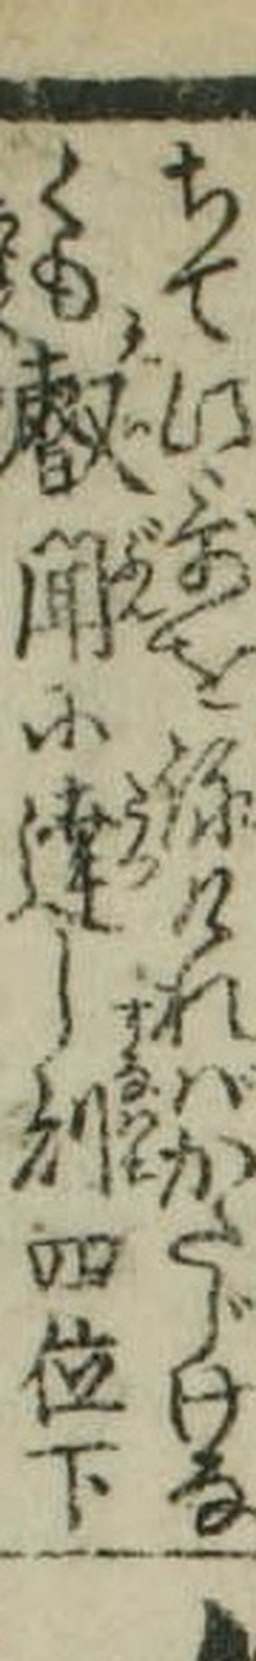くも叡聞に達し則四位下
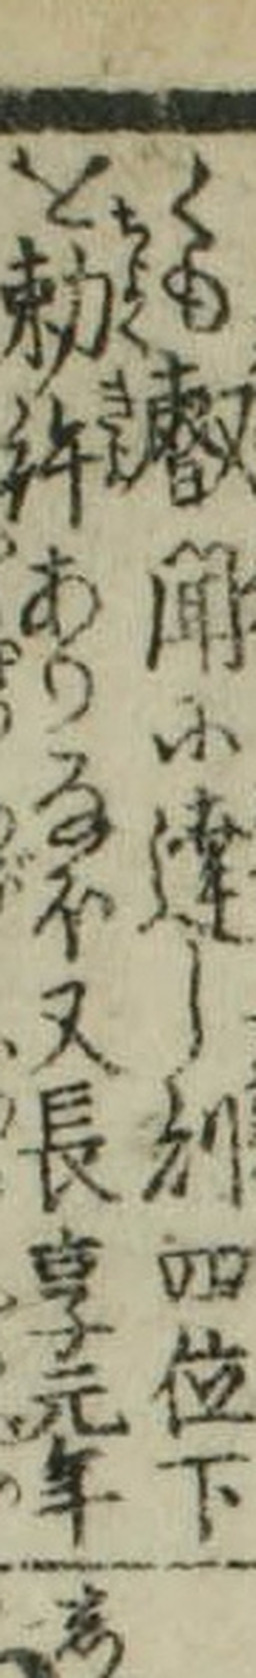を勅許ありなほ又長享元年
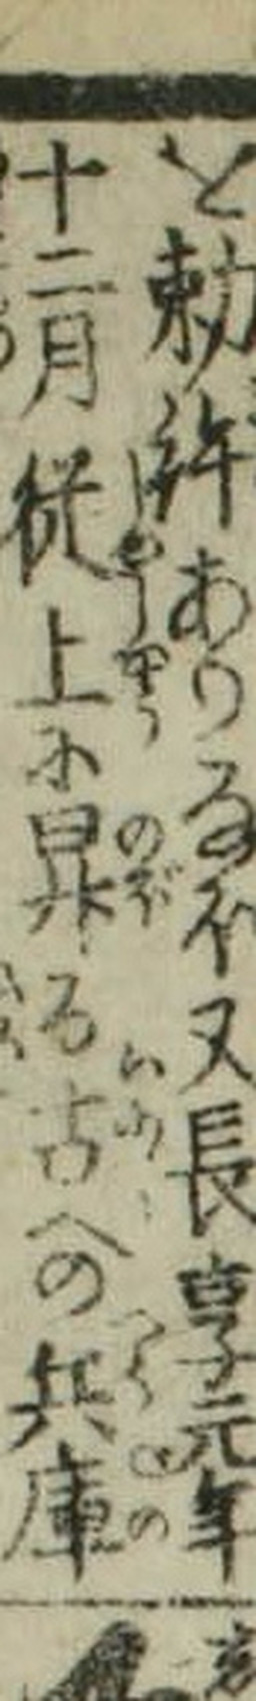十二月従上に昇る古への兵庫
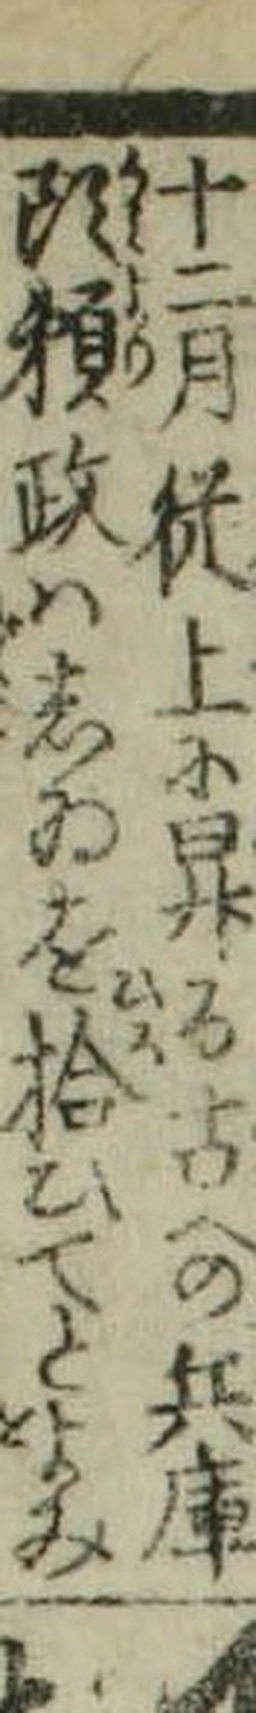頭頼政はしゐを拾ひてとよみ
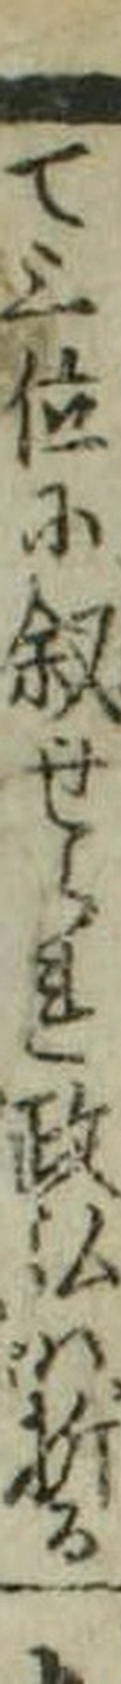て三位に叙せられ正弘は折る
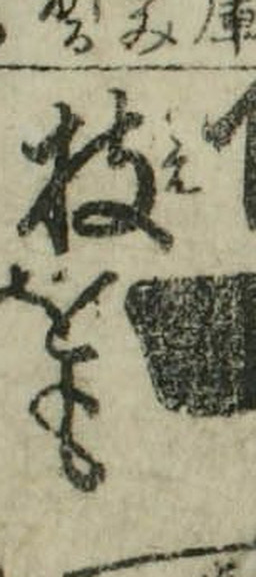枝をも
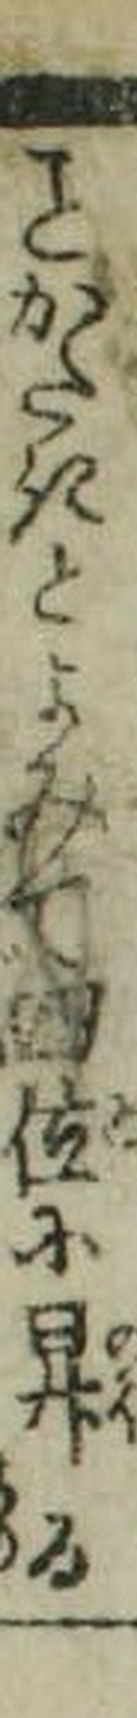ことかたきとよみて四位に昇る
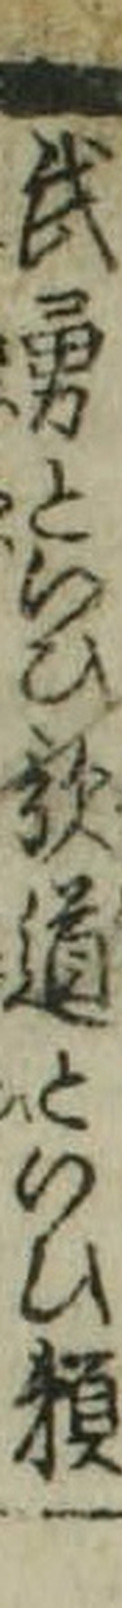武勇といひ歌道といひ頼
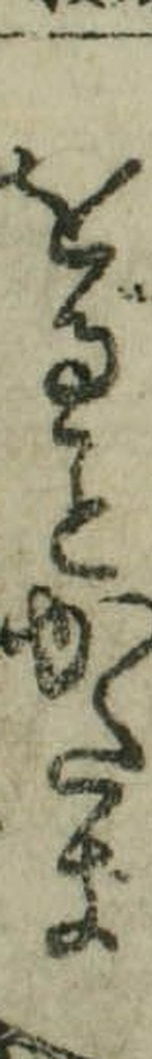をることかたき
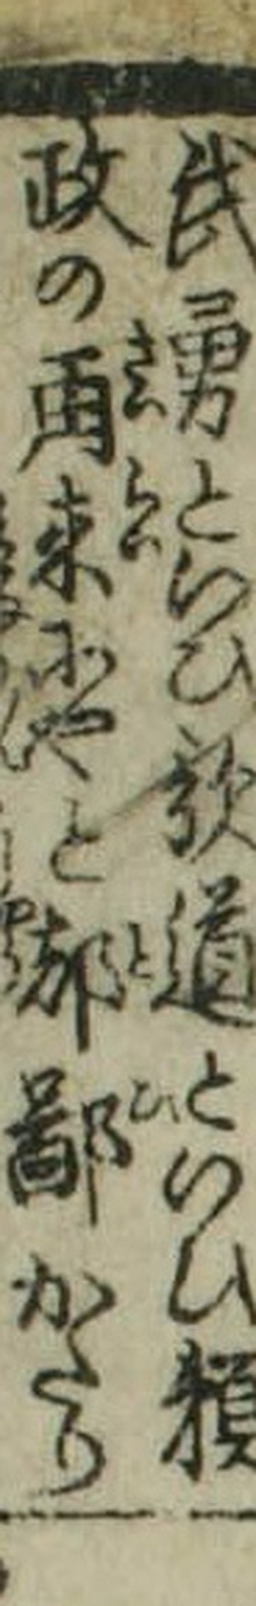政の再来にやと都鄙かたり
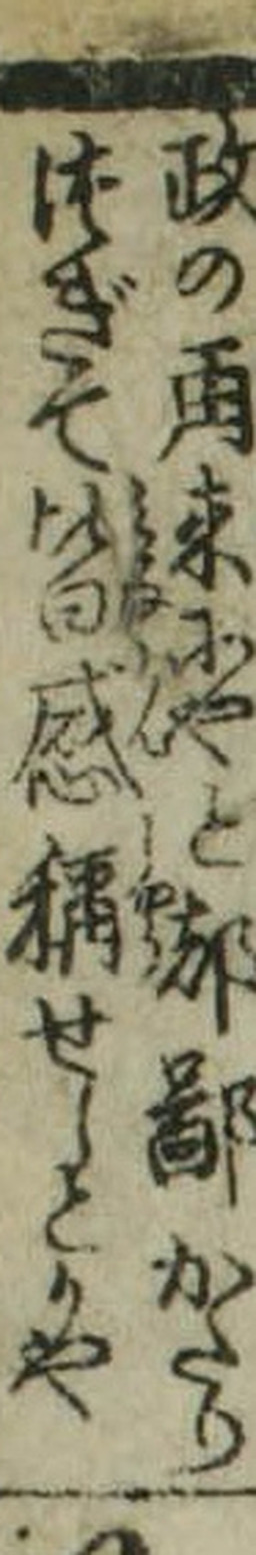つぎて皆感称せしとかや
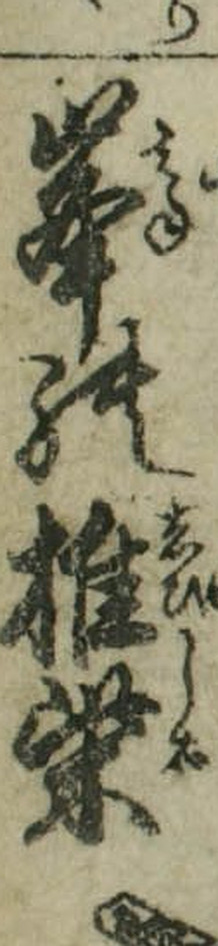峯の椎柴

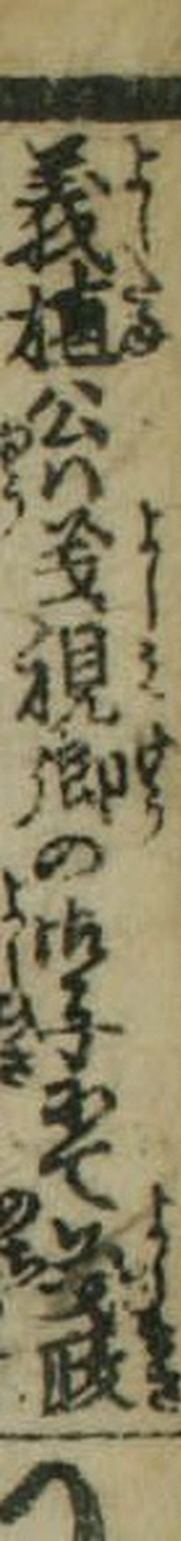義植公は義視卿の御子にて義政
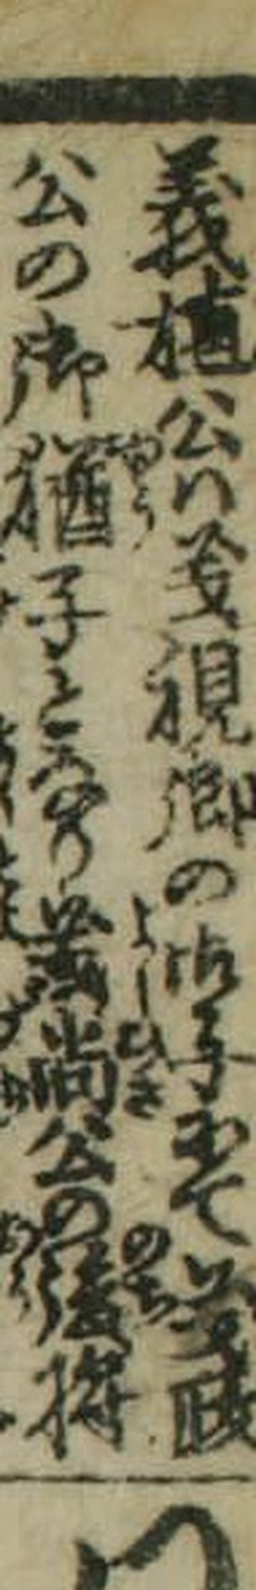公の御猶子となり義尚公の後将
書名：續英雄百人一首
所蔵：東京学芸大学附属図書館
